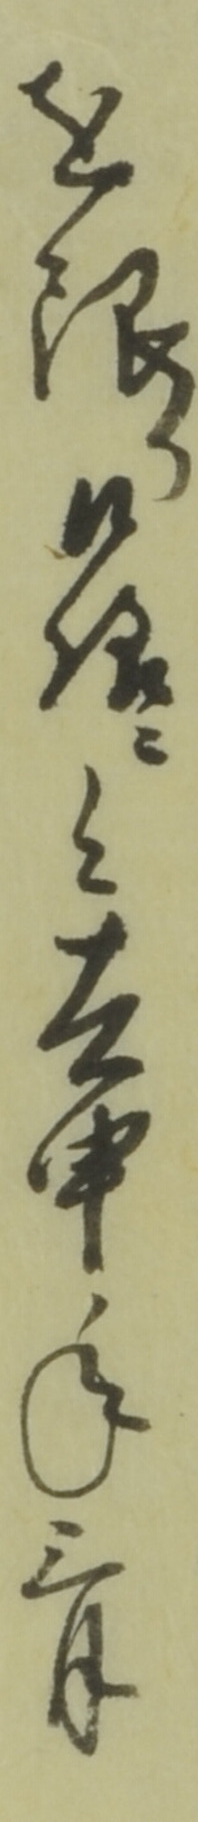を限り候様ニと去申年三月

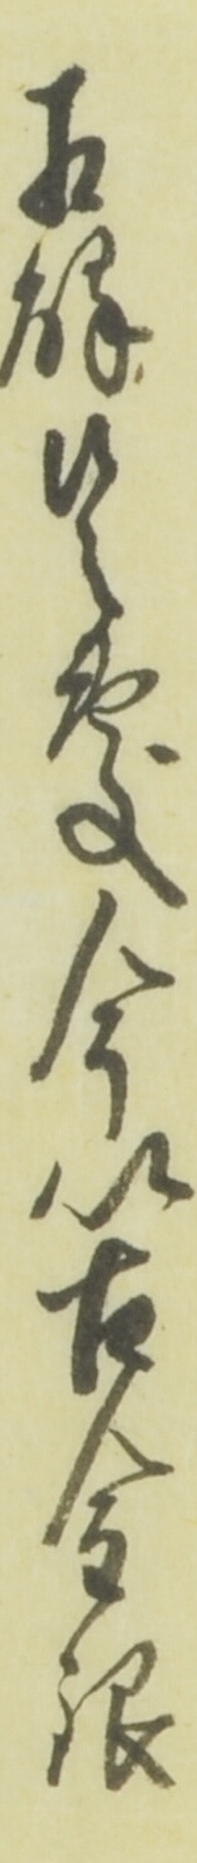相触候之処今以古金銀
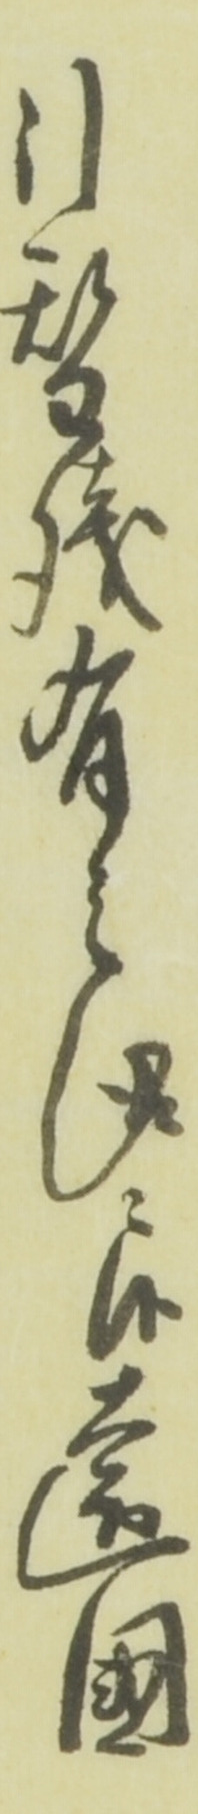引替銭有之趣ニ候遠国
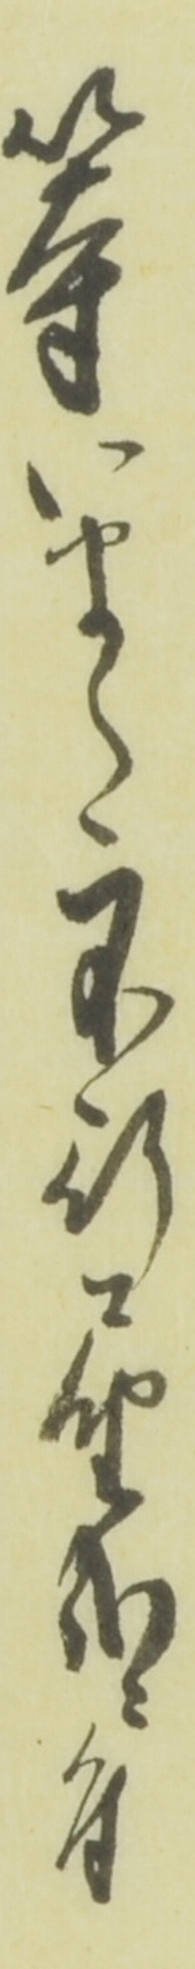等いまた不行届哉ニ付
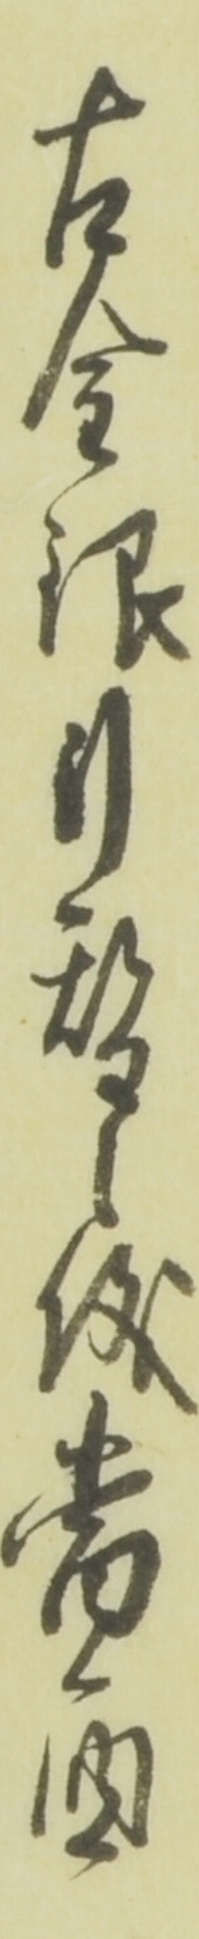古金銀引替候儀当酉
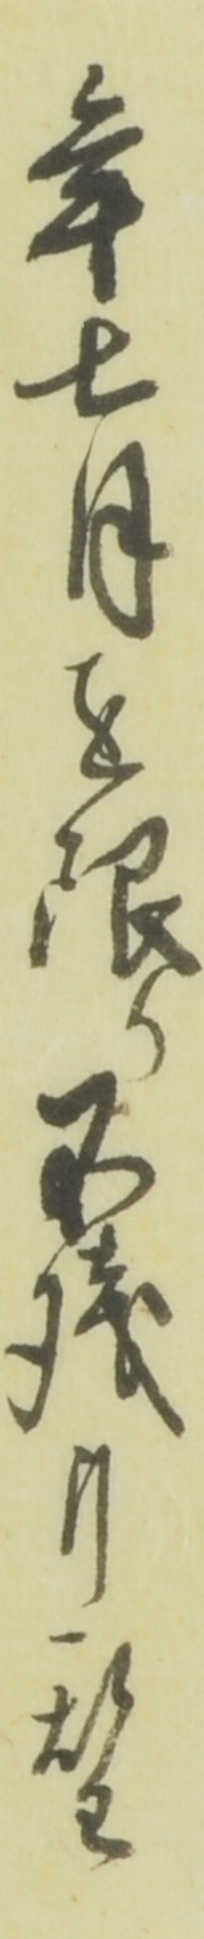年七月を限り不残引替
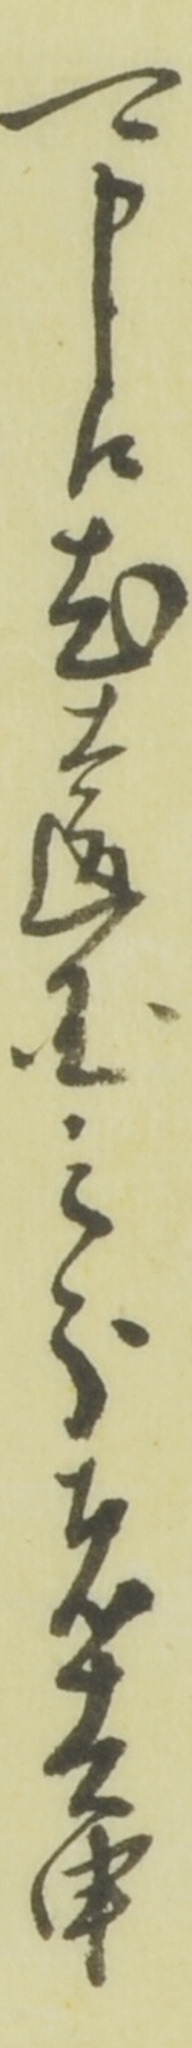可申候尤遠国之分は去申
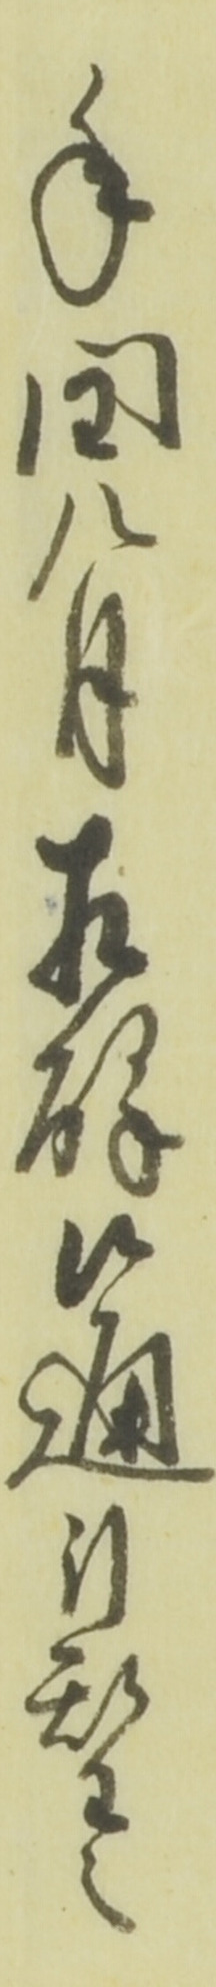年閏八月相触候通引替之
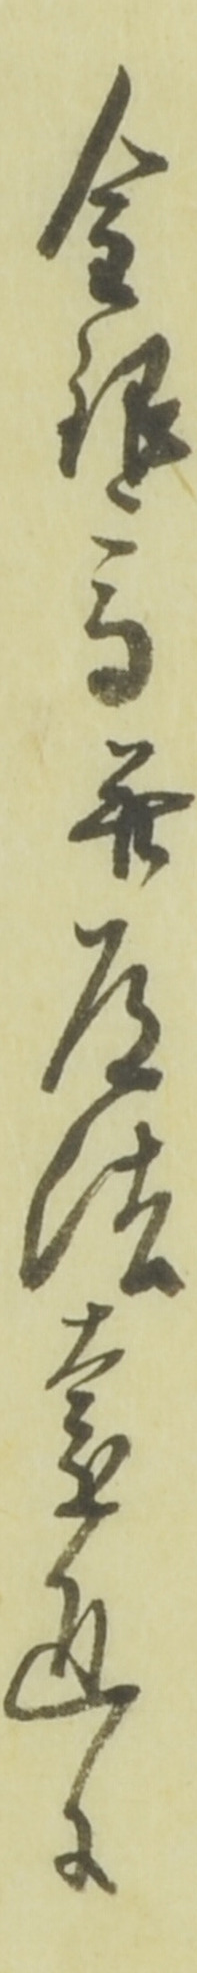金銀高并道法遠近に
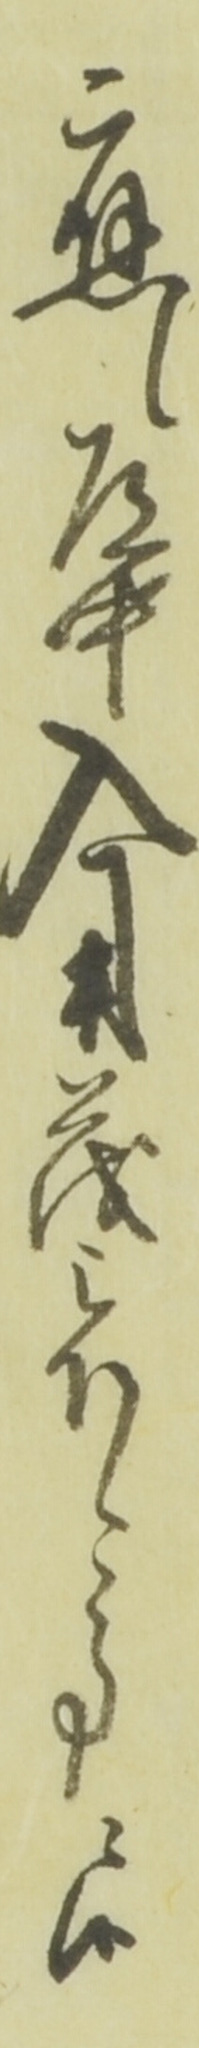応し道中入用も被下候事ニ候
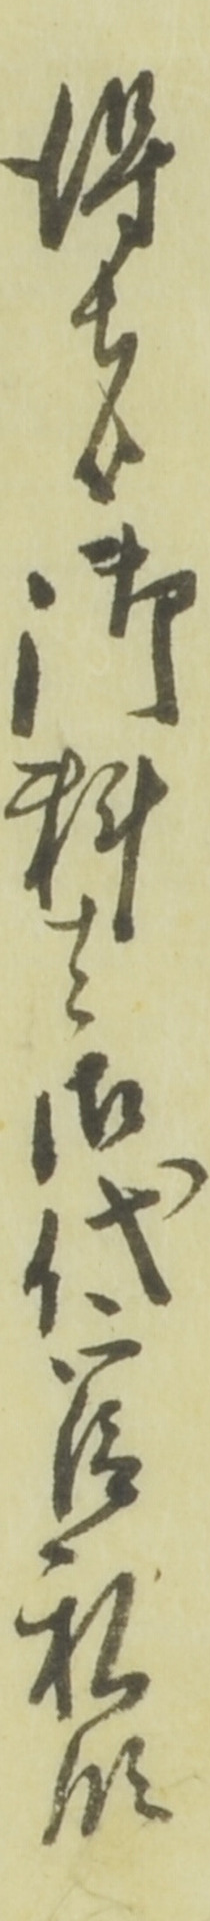得は御料は御代官私領
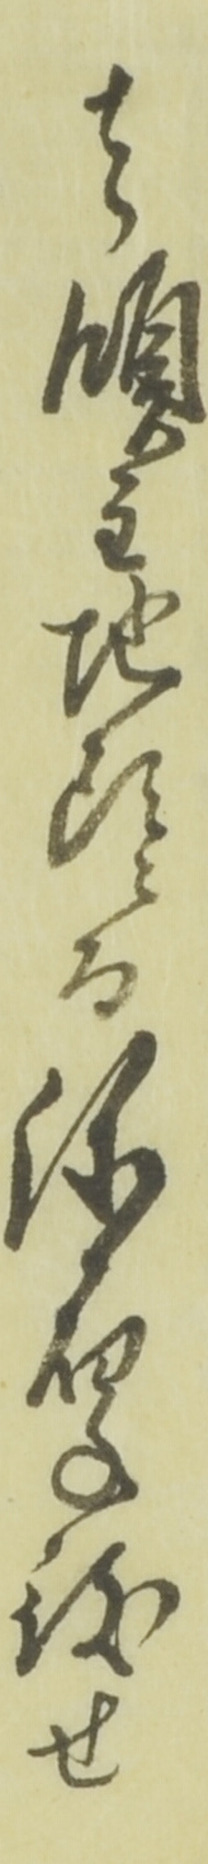は領主地頭ニ而弥厚致世
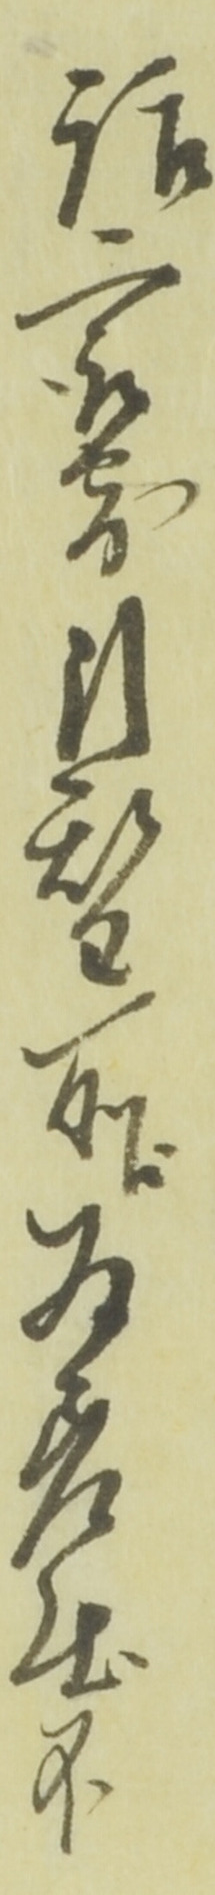話最寄引替所江為差出不
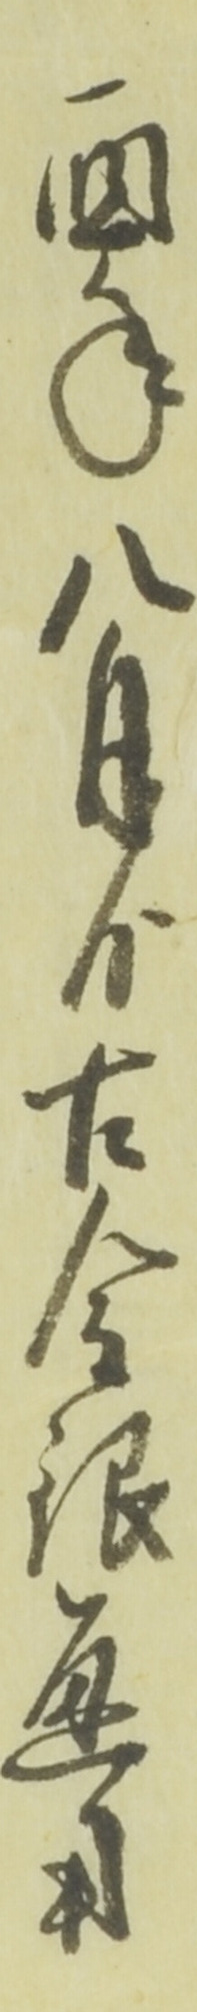酉年八月ゟ古金銀通用
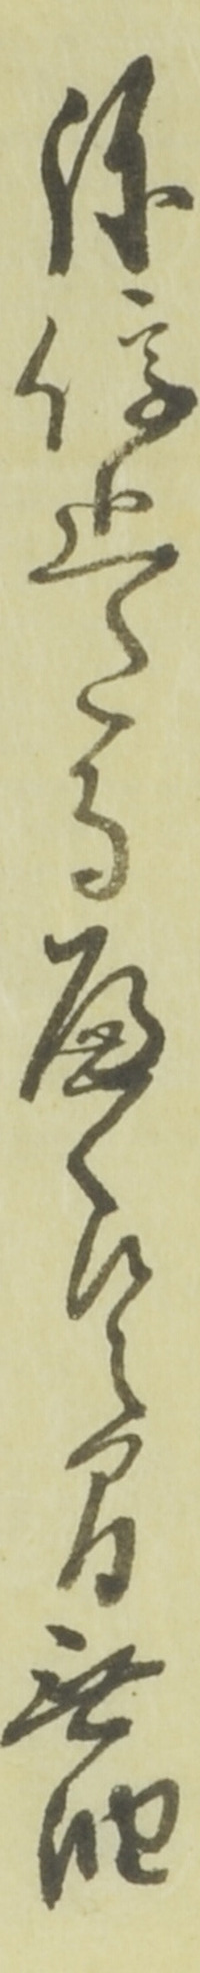弥停止たるへく候之間無油
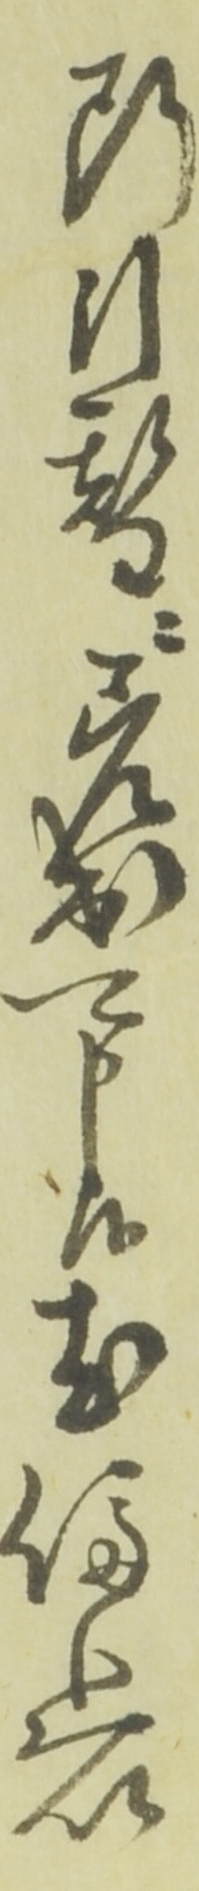断引替ニ差出可申候尤停止以
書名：御触書御書附控
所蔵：伊那市立高遠町図書館・合同会社AMANE
